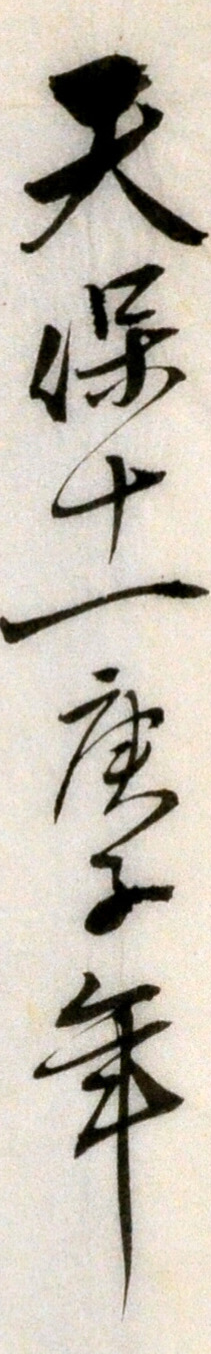天保十一庚子年
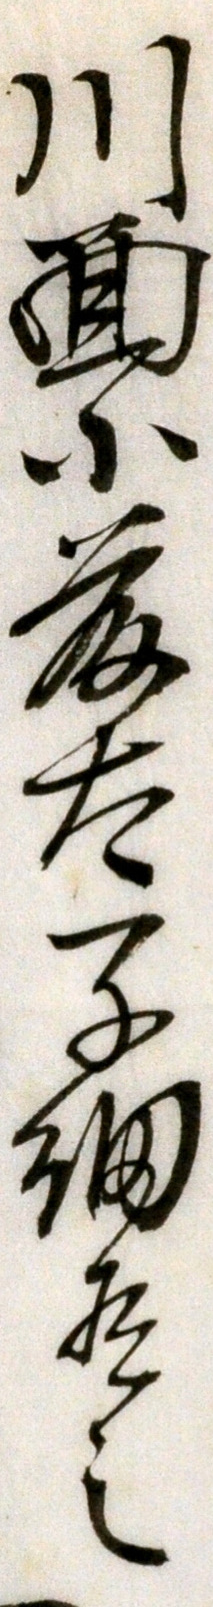川面小藤太子細有之
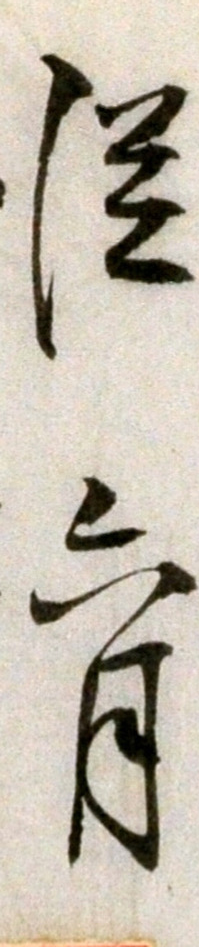従六月
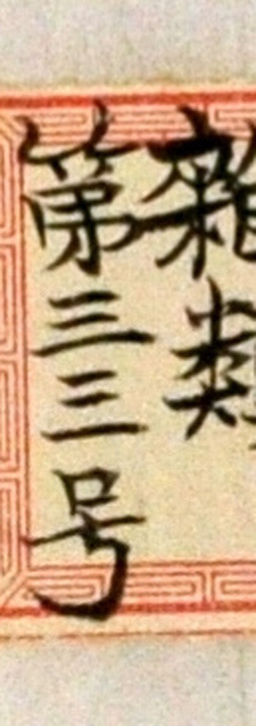第三三号
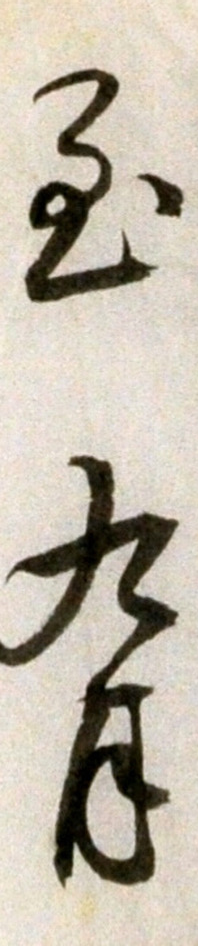至九月

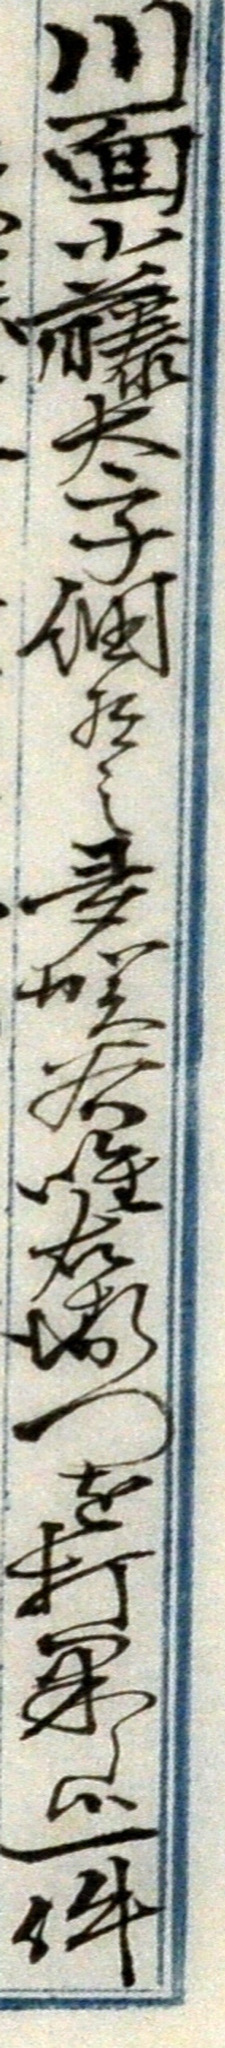川面小藤太子細有之多賀谷唯右衛門を打果し候一件
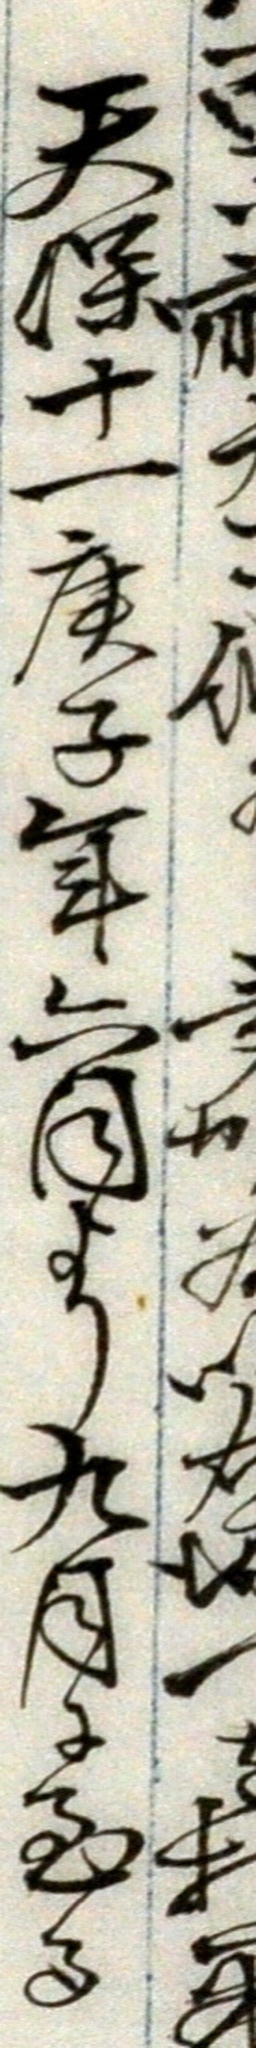天保十一庚子年六月より九月に至る
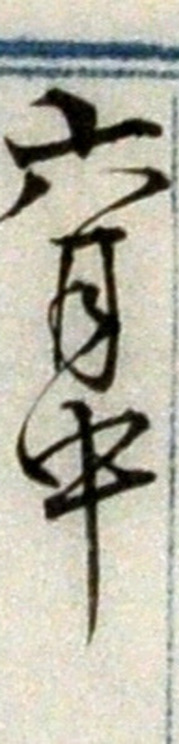六月中
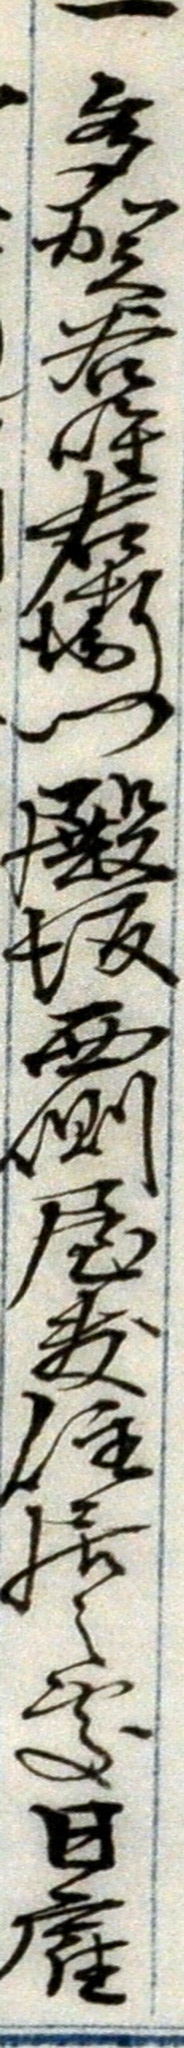一多賀谷唯右衛門殿坂西側屋敷住居之處日雇
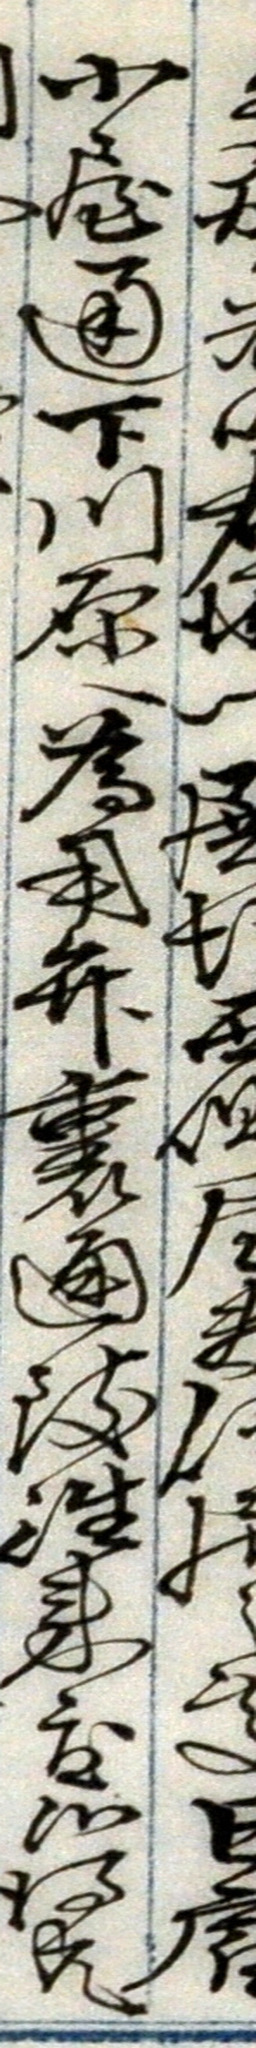小屋通下川原へ為用弁裏通致往来度候得共
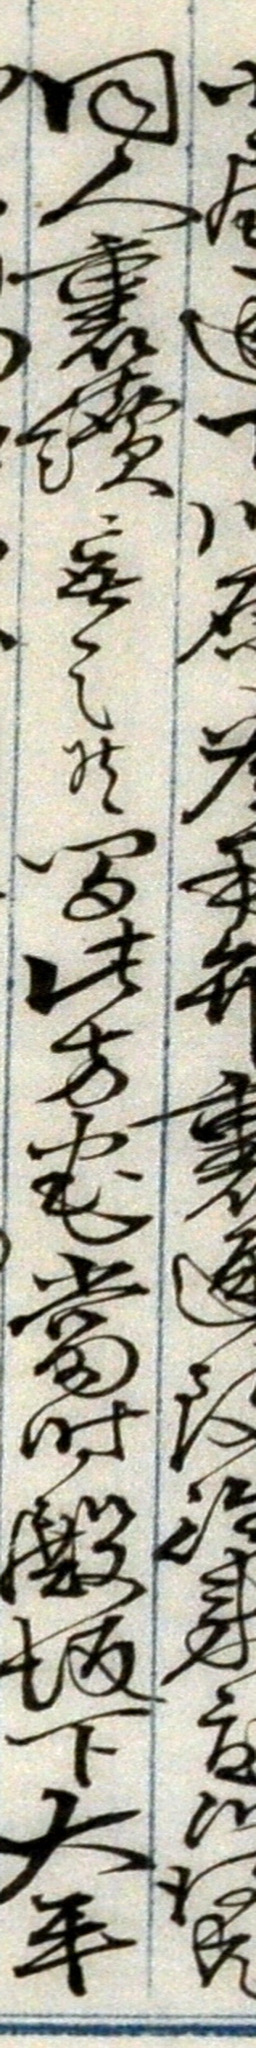同人裏続ニ無之候間此方宅当時殿坂下大平
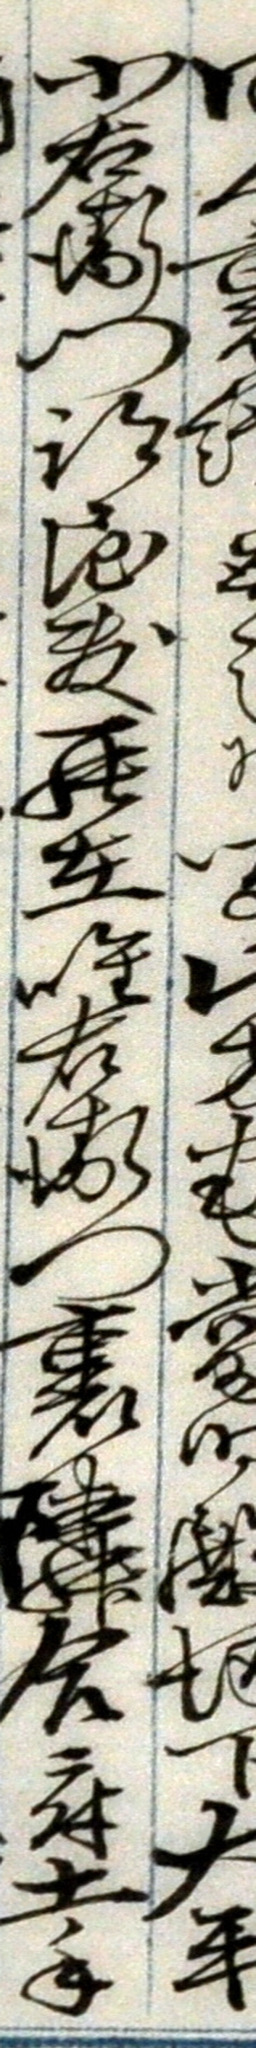小右衛門跡屋敷罷在唯右衛門裏隣合二付土手
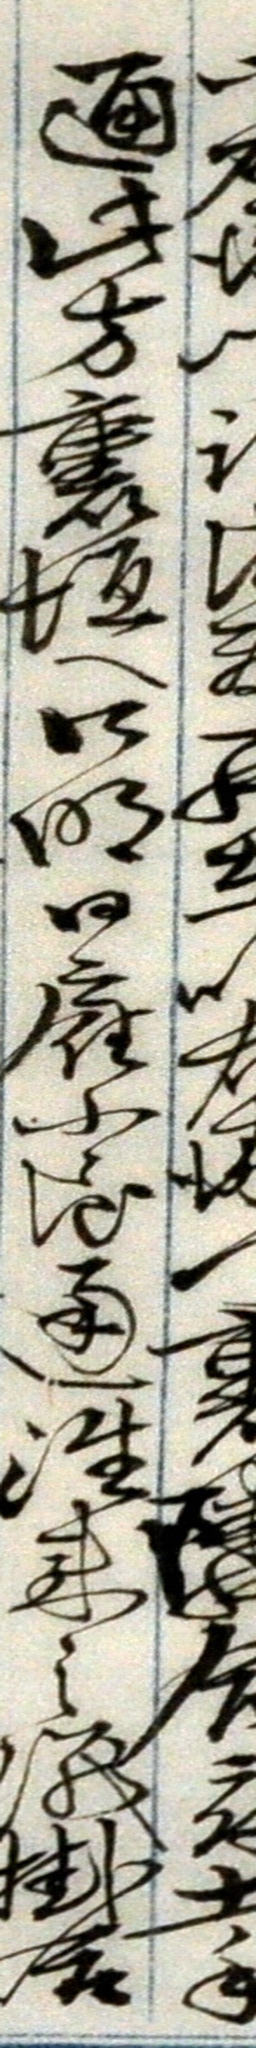通此方裏垣へ口明日雇小屋通往来之儀掛合
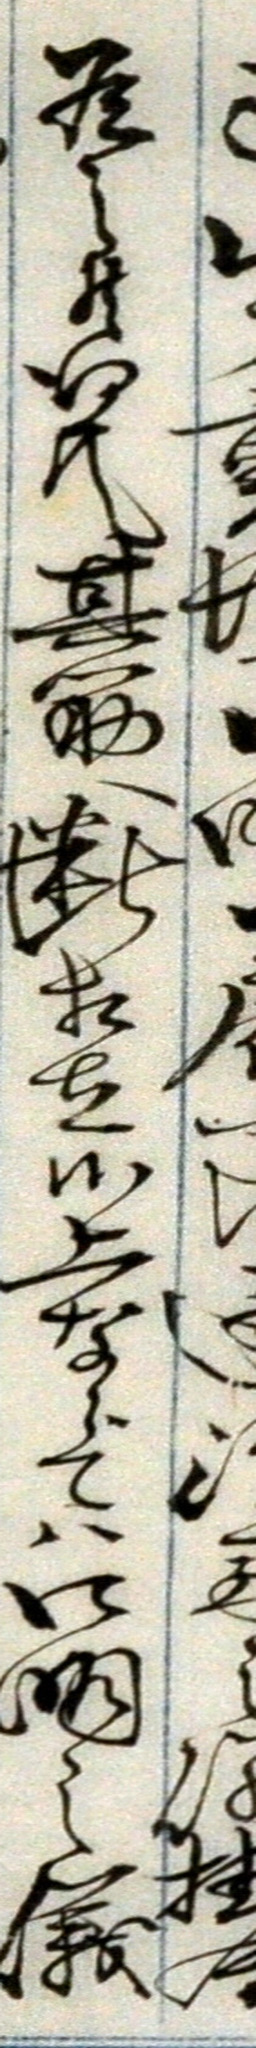有之候得共其筋へ断相立候上ならてハ口明之儀
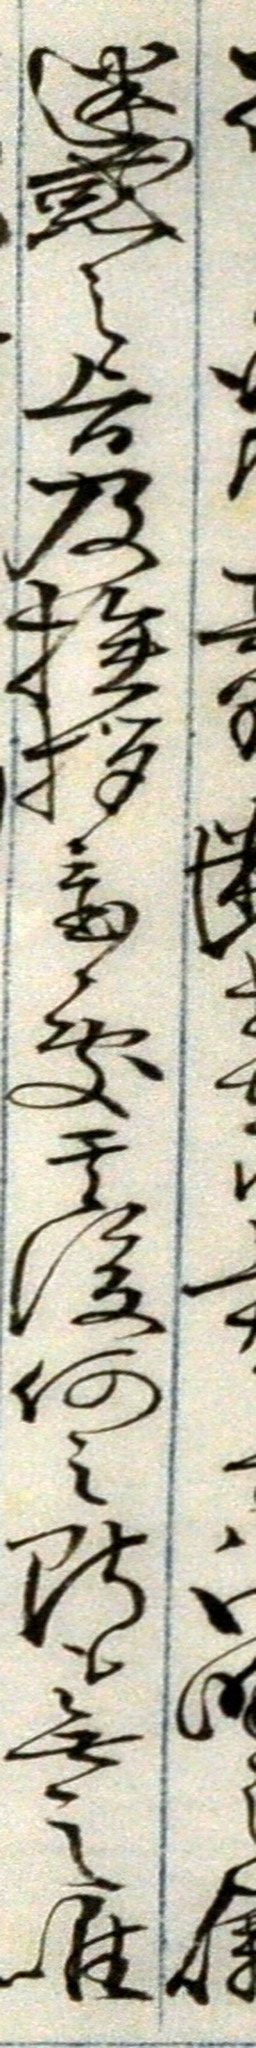迷惑之旨及挨拶置候處其後何之断も無之唯
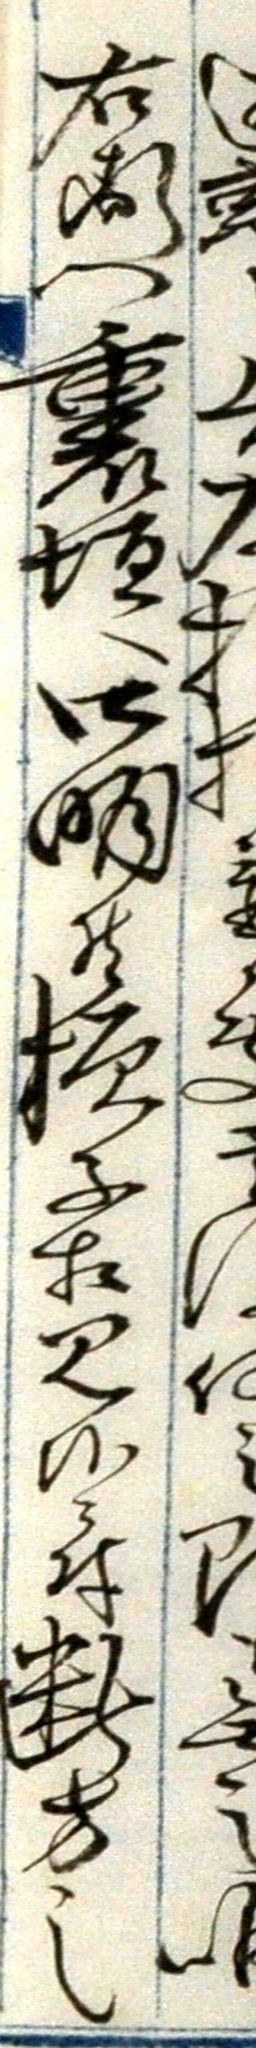右衛門裏垣へ口明候様子相見候ニ付断方之
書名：川面小藤太子細有之多賀谷唯右衛門ヲ打果候一件
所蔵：伊那市立高遠町図書館・合同会社AMANE
